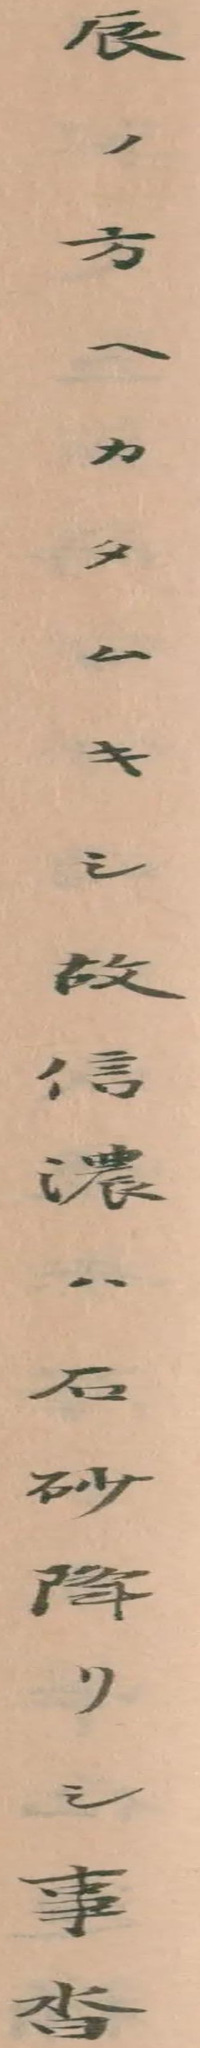辰ノ方へカタムキシ故信濃ハ石砂降リシ事沓
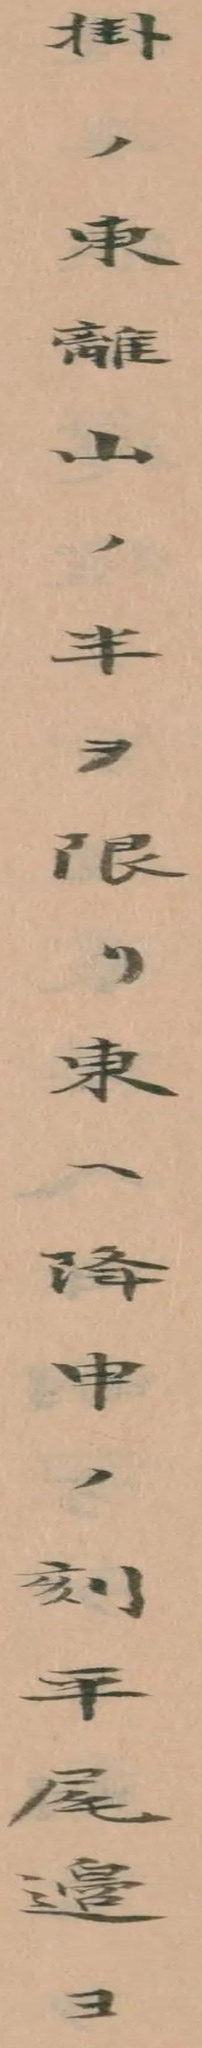掛ノ東離山ノ半ヲ限り東へ降申ノ刻平尾辺ヨ
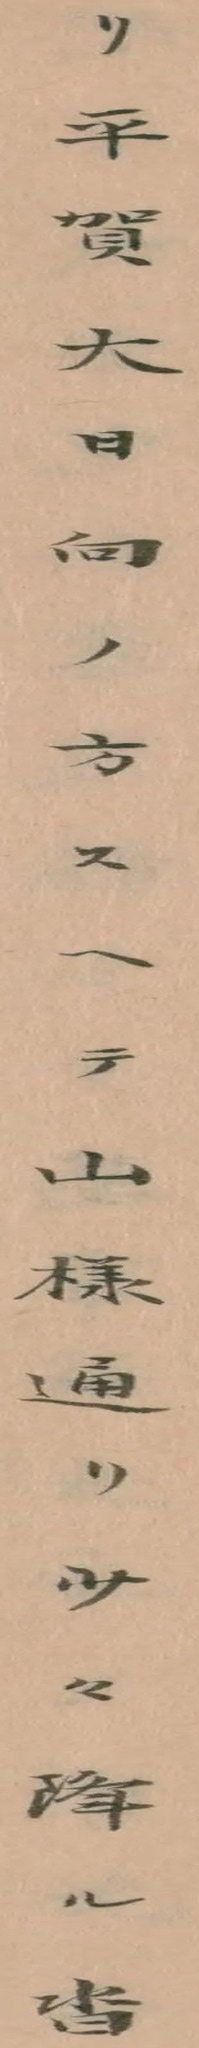リ平賀大日向ノ方スヘテ山様通り少々降ル沓
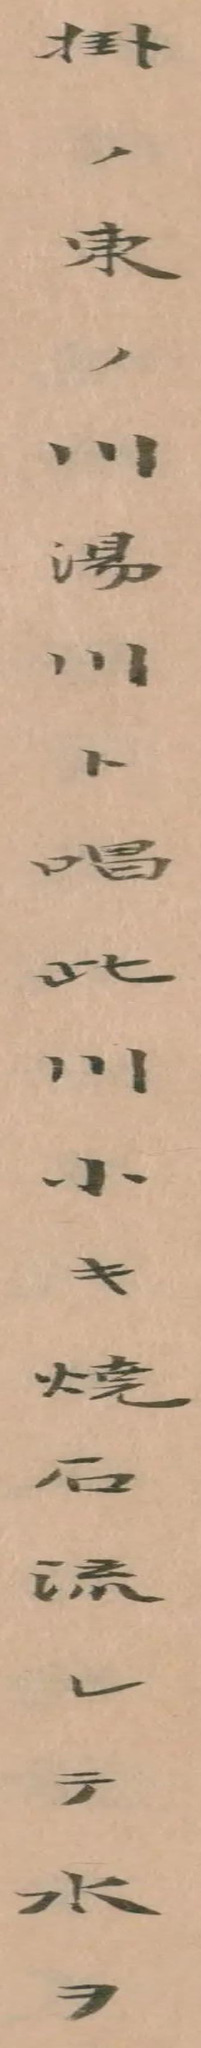掛ノ東ノ川湯川ト唱此川小キ焼石流レテ水ヲ
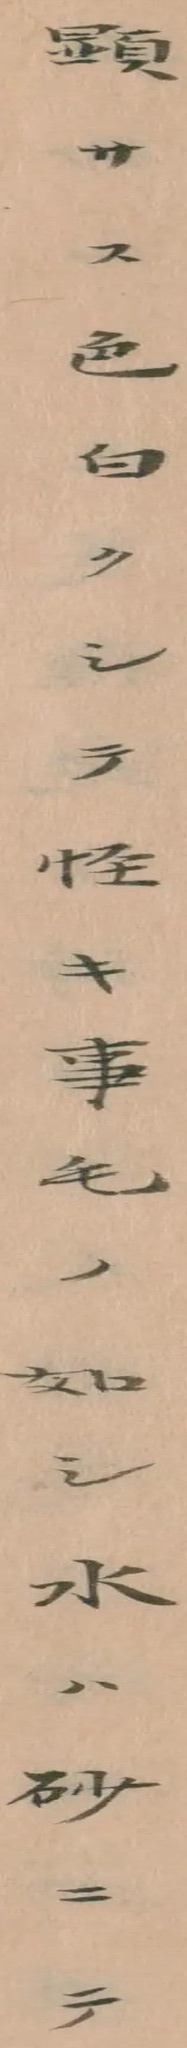顕サス色白クシテ怪キ事毛ノ如シ水ハ砂ニテ
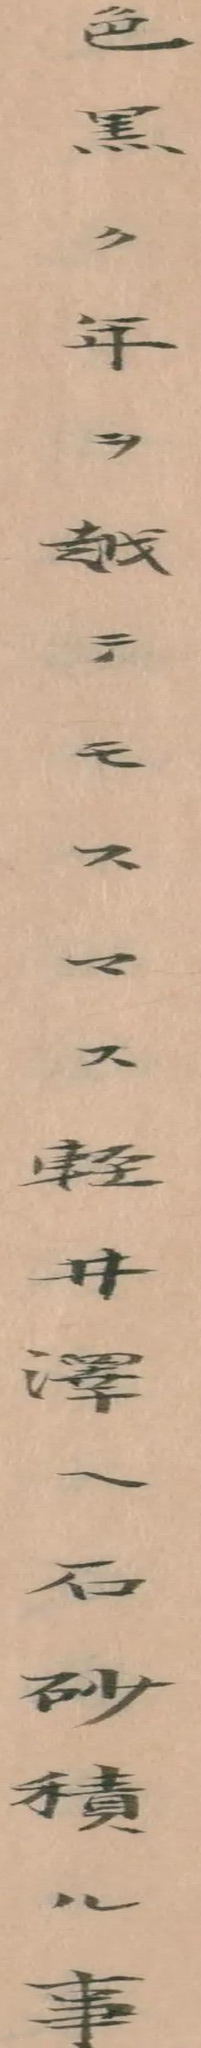色黒ク年ヲ越テモスマス軽井沢へ石砂積ル事
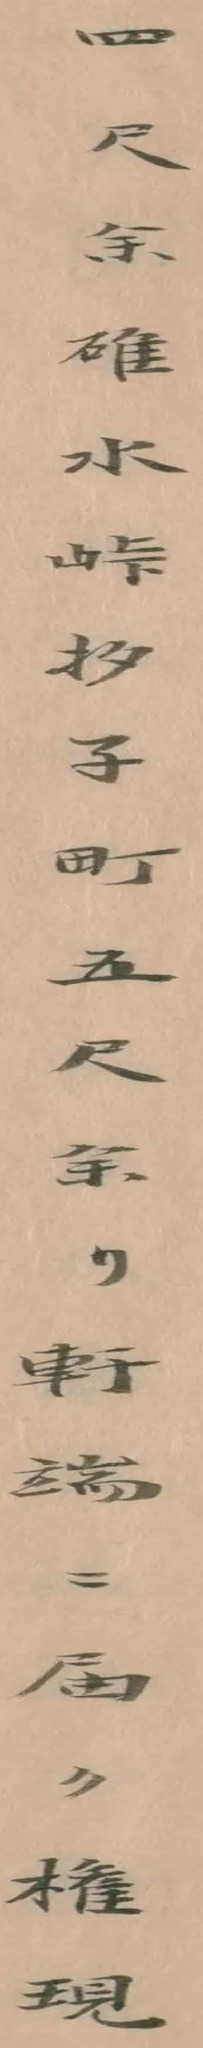四尺余碓井峠杓子町五尺余り軒下二届ク権現
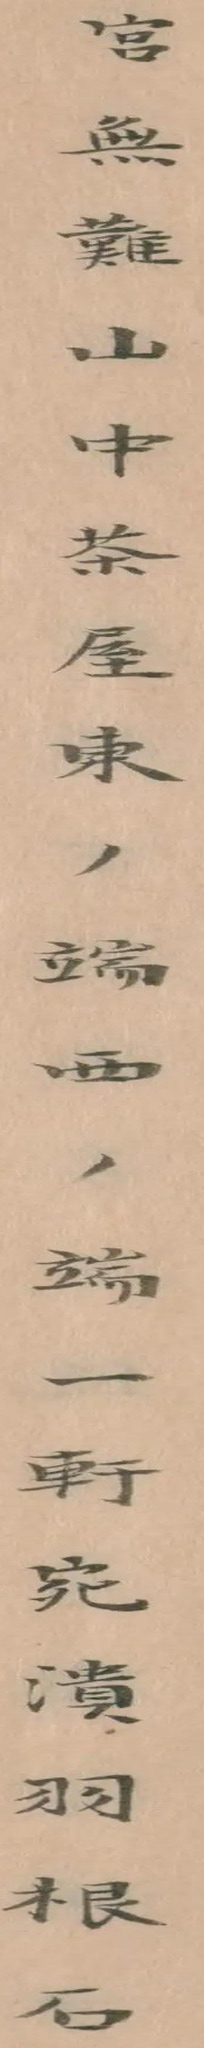宮無難山中茶屋東ノ端西ノ端一軒宛潰羽根石
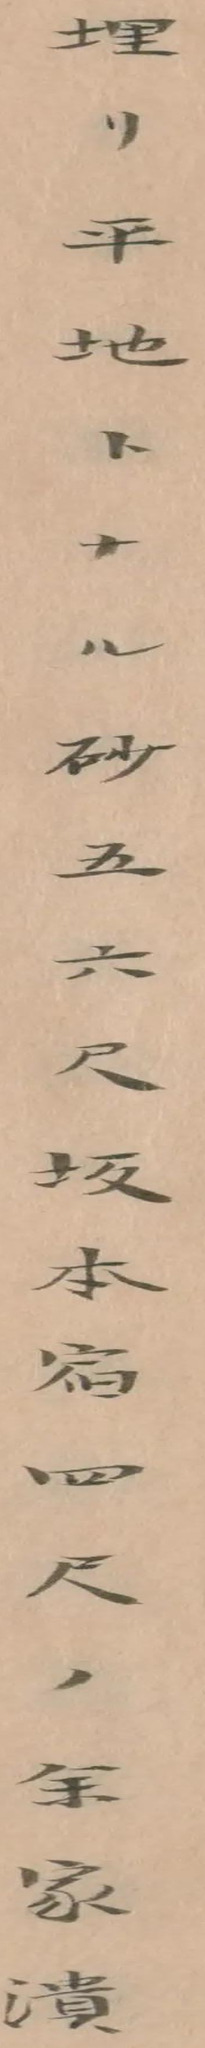埋り平地トナル砂五六尺坂本宿四尺ノ余家潰
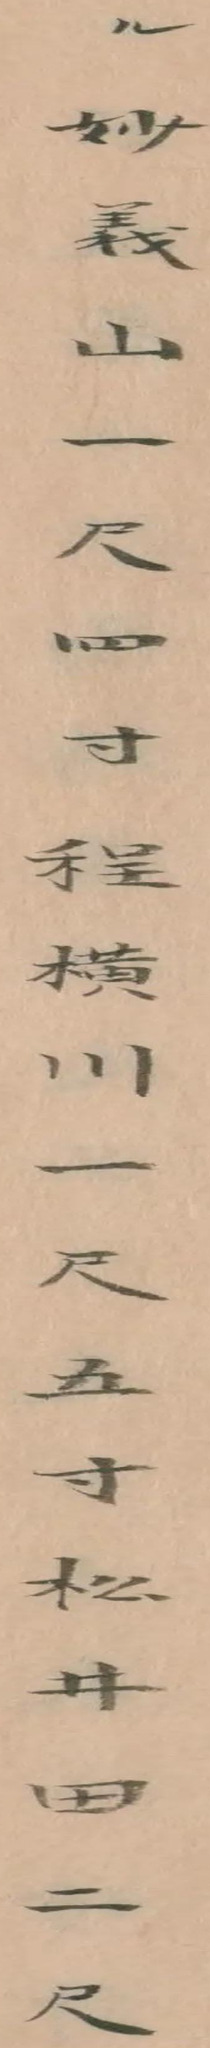ル妙義山一尺四寸程横川一尺五寸松井田二尺

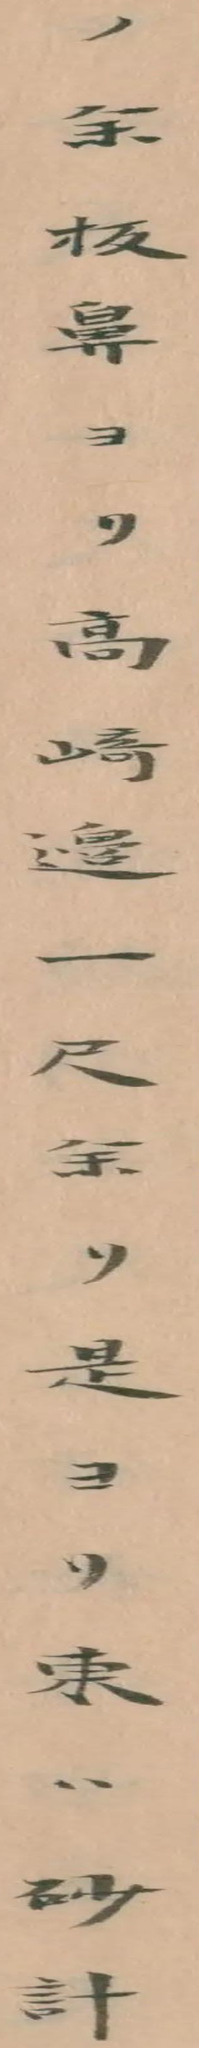ノ余板鼻ヨリ高崎辺一尺余リ是ヨリ東ハ砂計
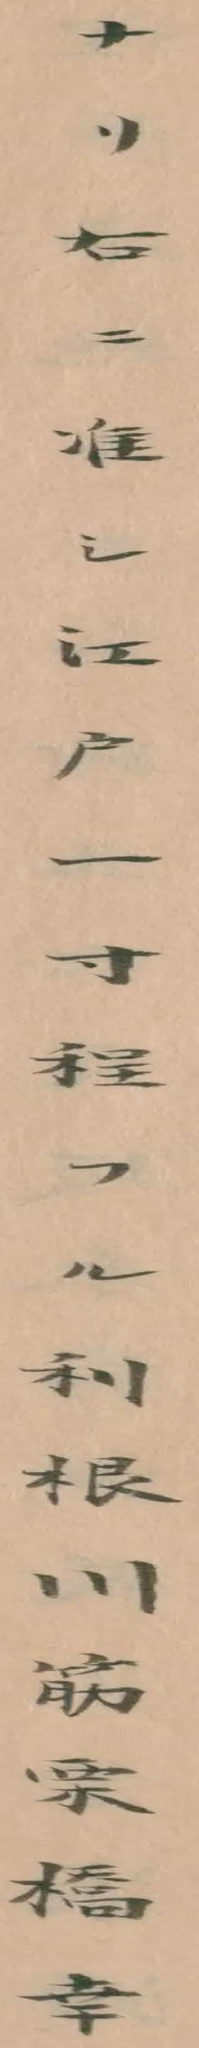ナリ右二準シ江戸一寸程フル利根川筋栗橋幸
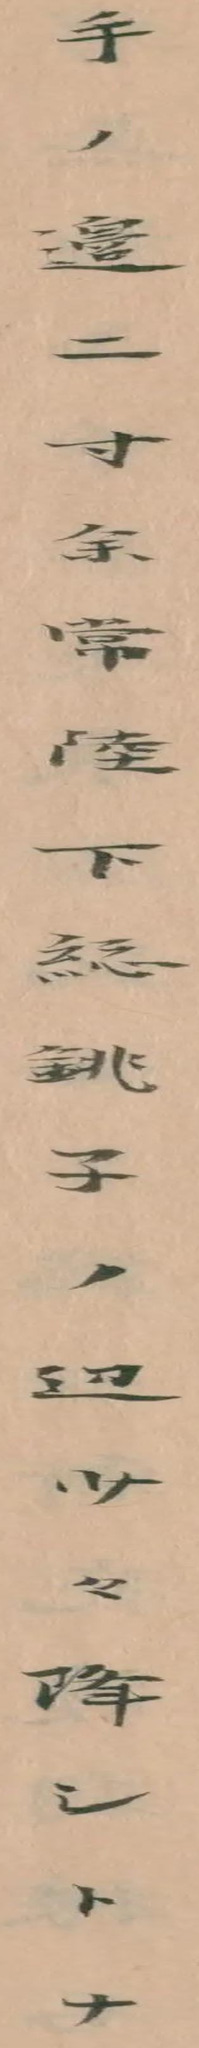手ノ辺二寸余常陸下総銚子ノ辺少々降シトナ
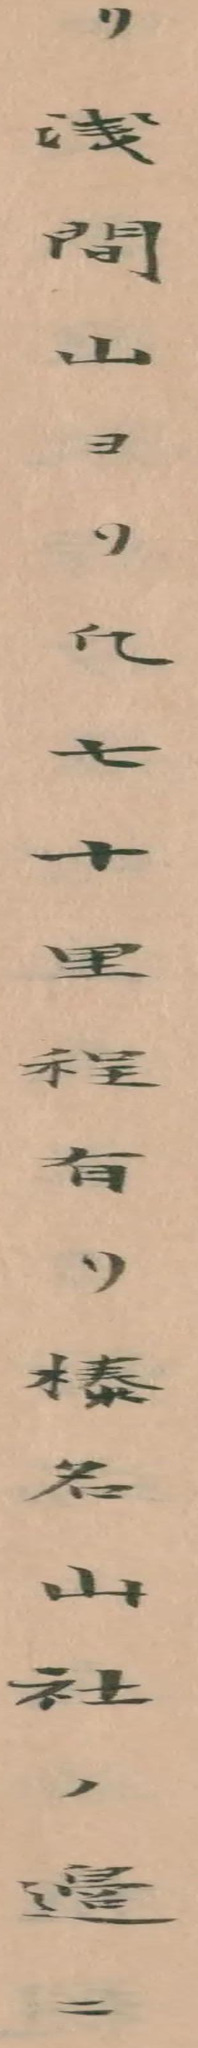リ浅間山ヨリ凡七十里程有り榛名山社ノ辺二
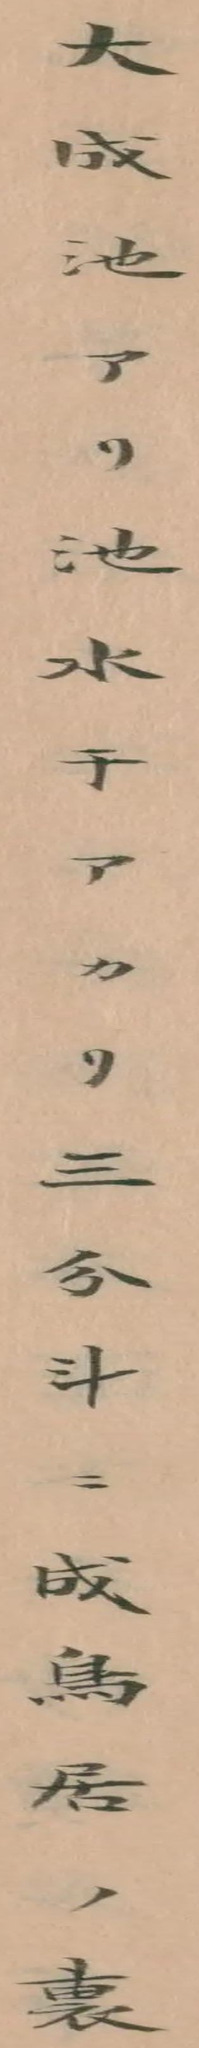大成池アリ池水干アカリ三分斗二成鳥居ノ裏
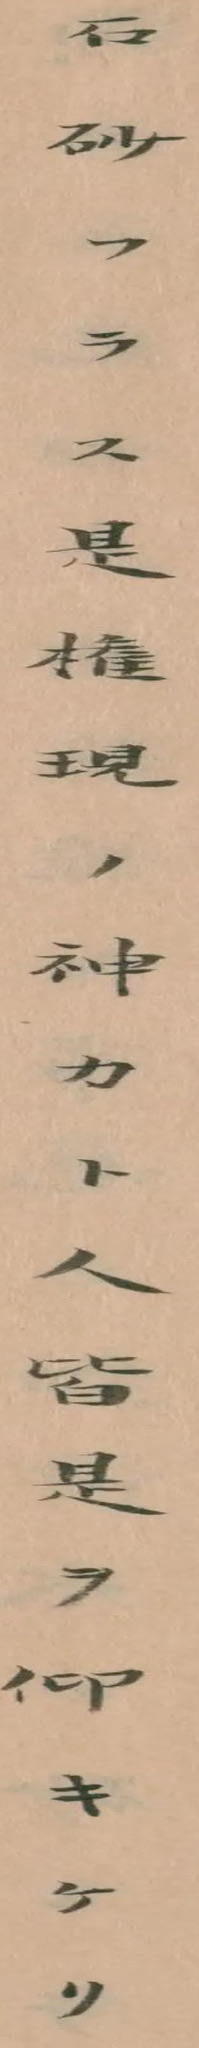石砂フラス是権現ノ神力ト人皆是ヲ仰キケリ
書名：地災撮要. 巻3(地震之部)-巻4(噴火之部)
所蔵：国立国会図書館 National Diet Library, JAPAN
